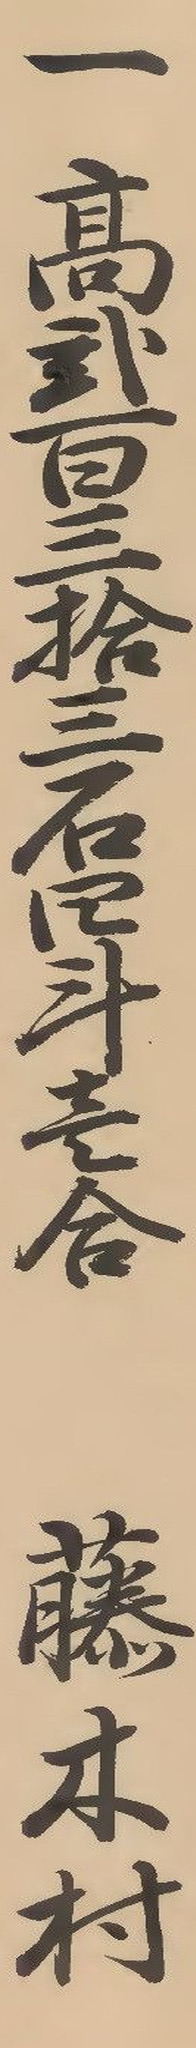一高弐百三拾三石四斗壱合藤木村
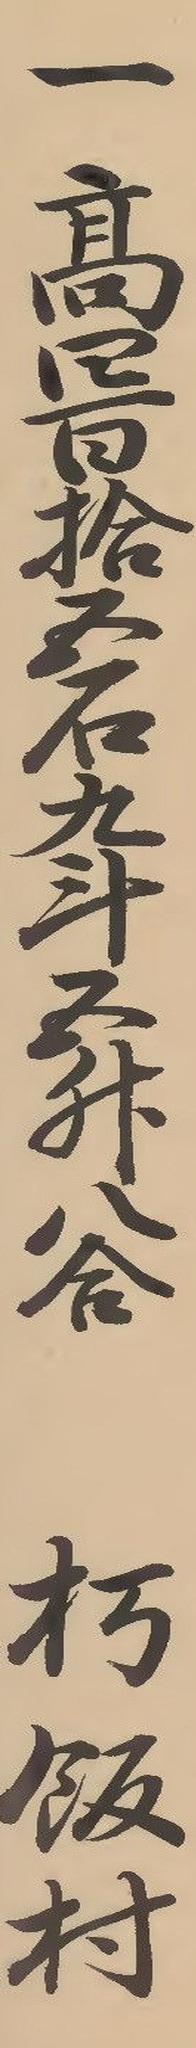一高四百拾五石九斗五升八合朽飯村
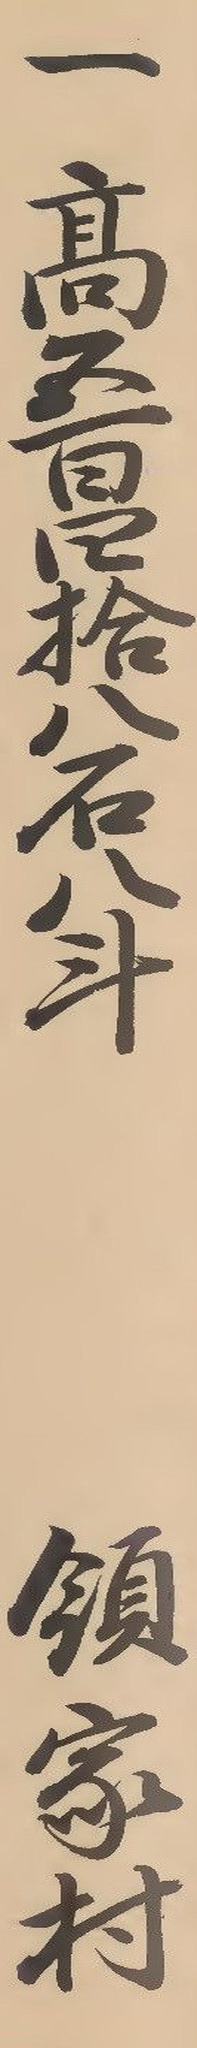一高五百四拾八石八斗領家村
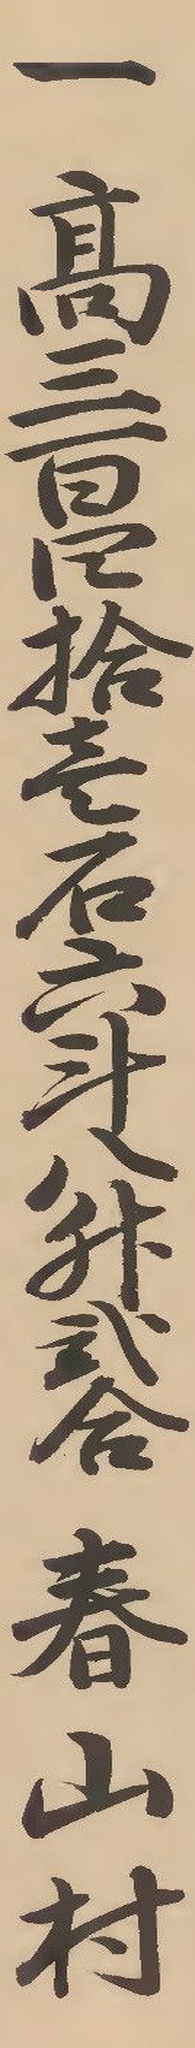一高三百四拾壱石六斗八升弐合春山村

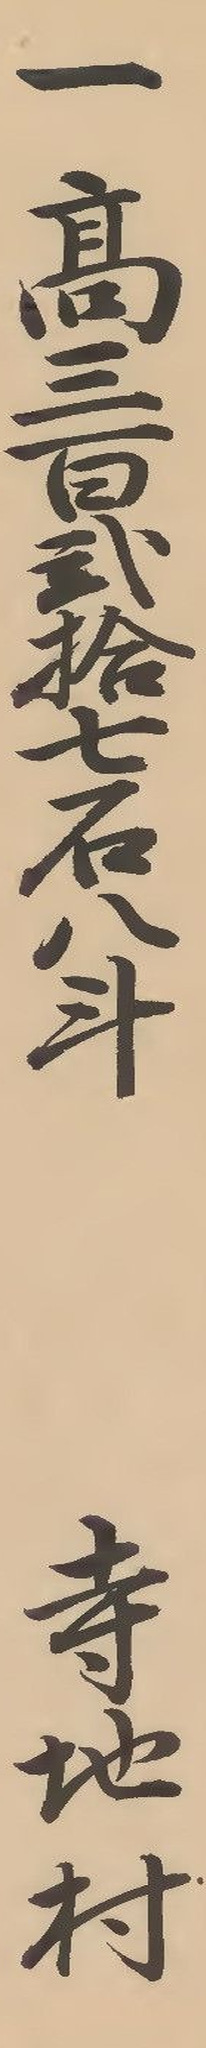一高三百弐拾七石八斗寺地村
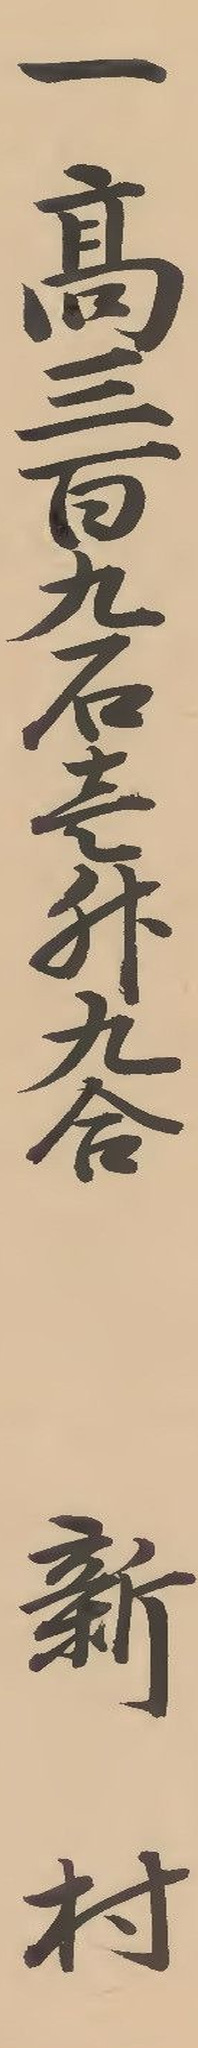一高三百九石壱升九合新村
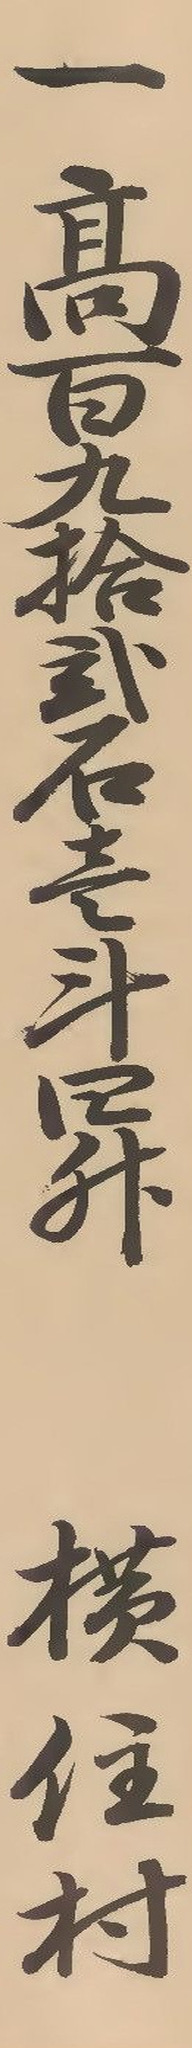一高百九拾弐石壱斗四升横住村
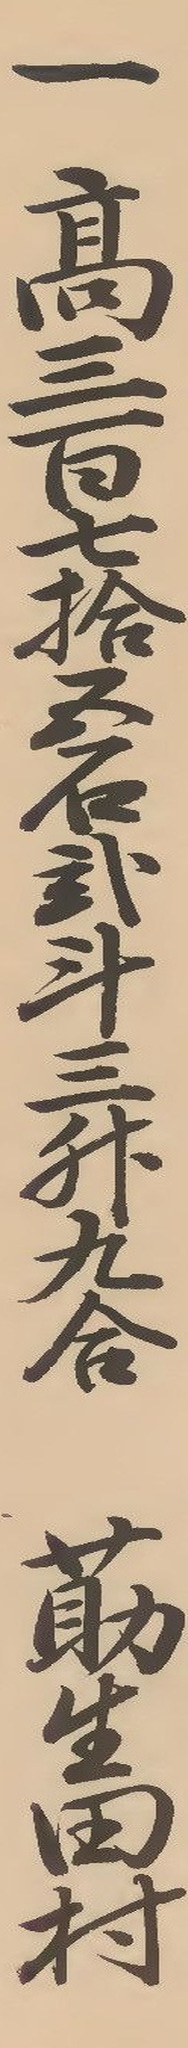一高三百七拾五石弐斗三升九合莇生田村
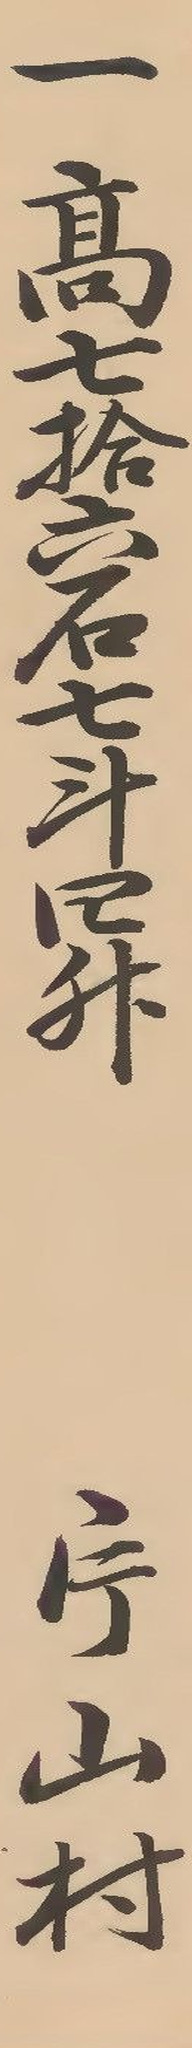一高七拾六石七斗四升片山村

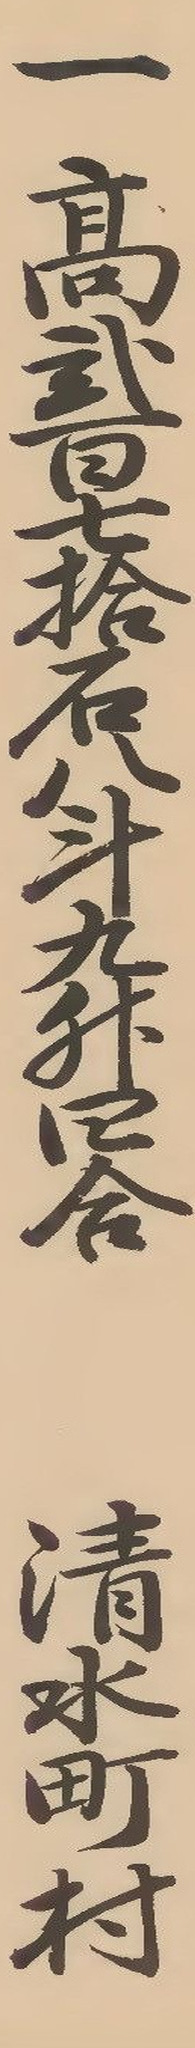一高弐百七拾石八斗九升四合清水町村
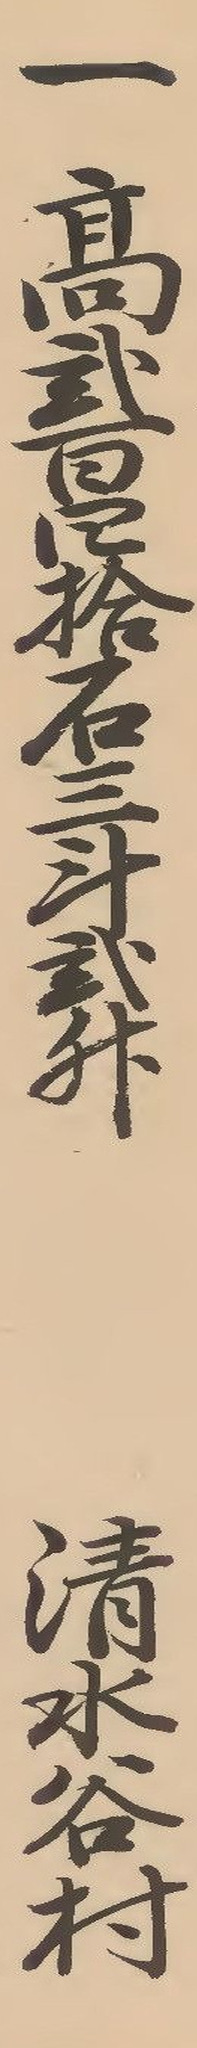一高弐百四拾石三斗弐升清水谷村
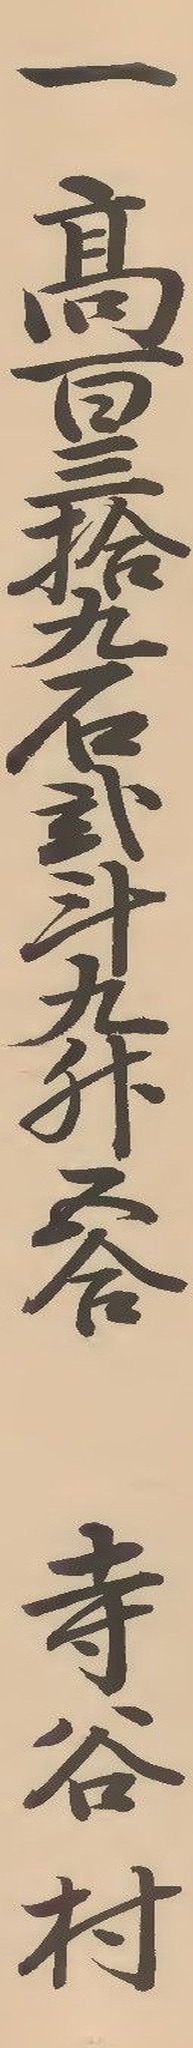一高百三拾九石弐斗九升五合寺谷村
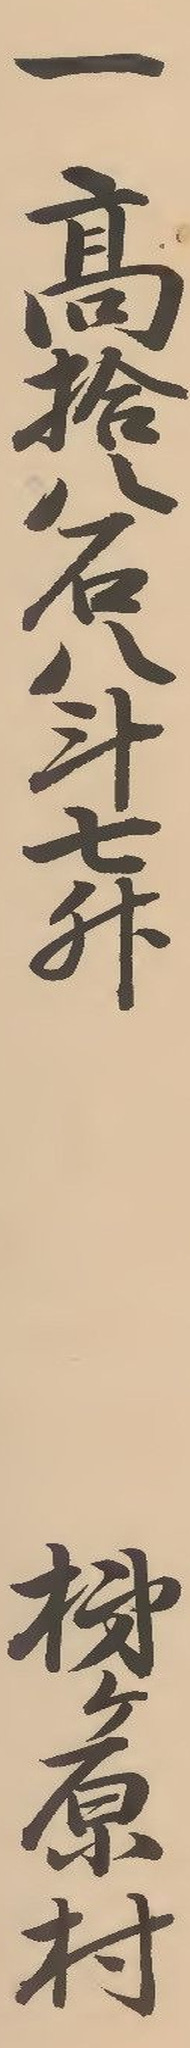一高拾八石八斗七升柿ヶ原村
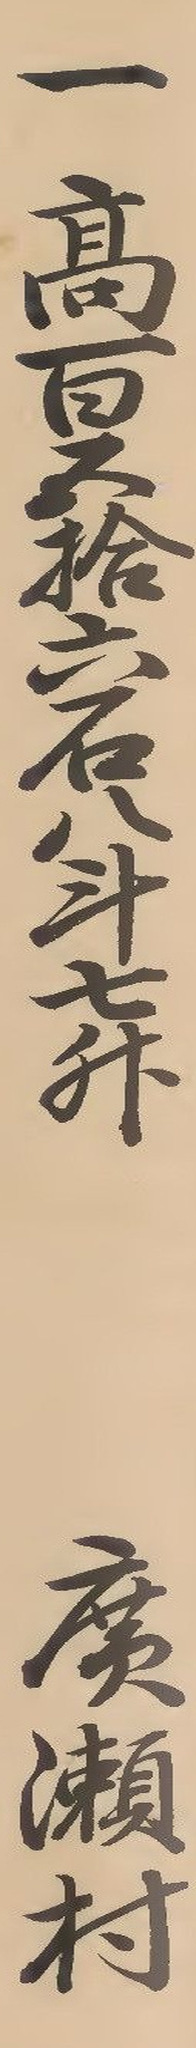一高百五拾六石八斗七升広瀬村
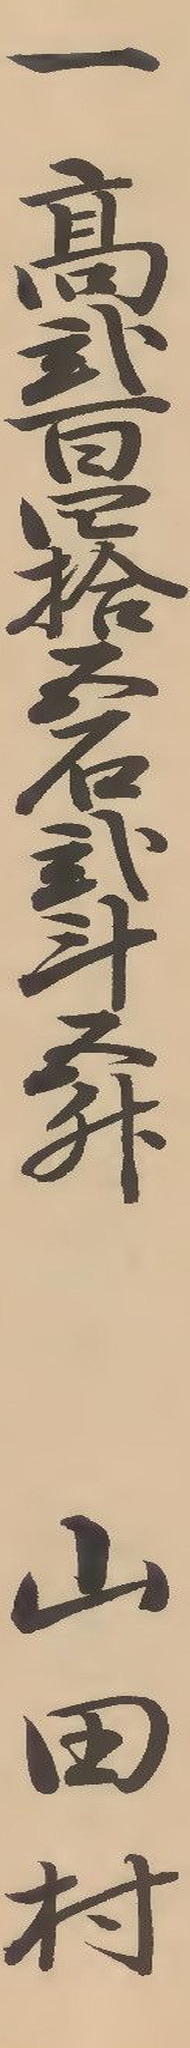一高弐百四拾五石弐斗五升山田村
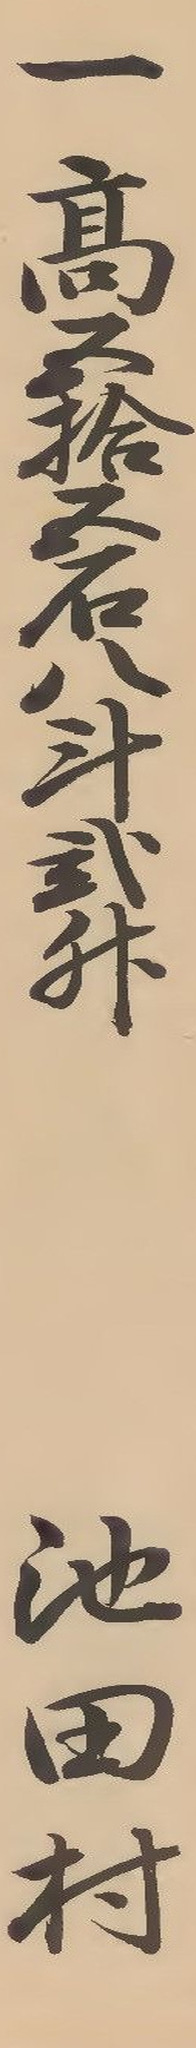一高五拾五石八斗弐升池田村
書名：越前国郷帳
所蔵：国立公文書館 National Archives of Japan
